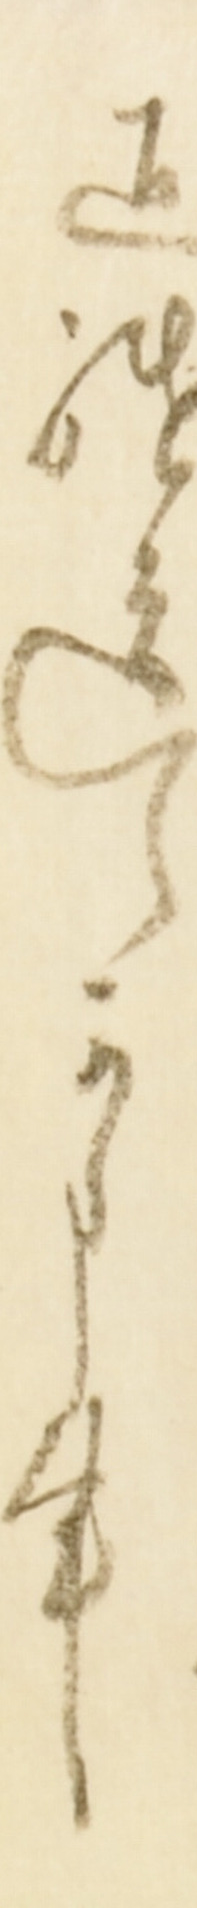迄継送り可申事
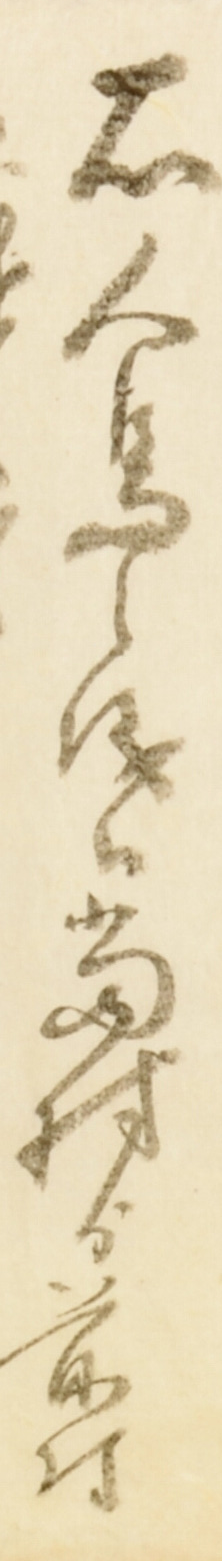右人馬之儀ハ当村ゟ前村

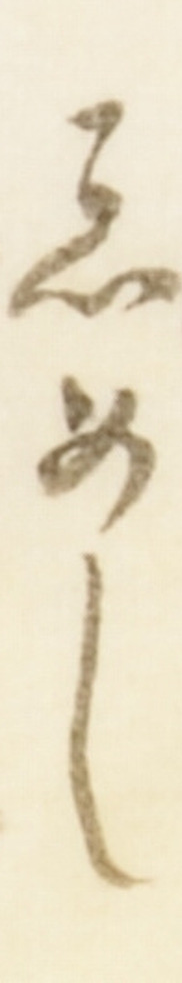しめし
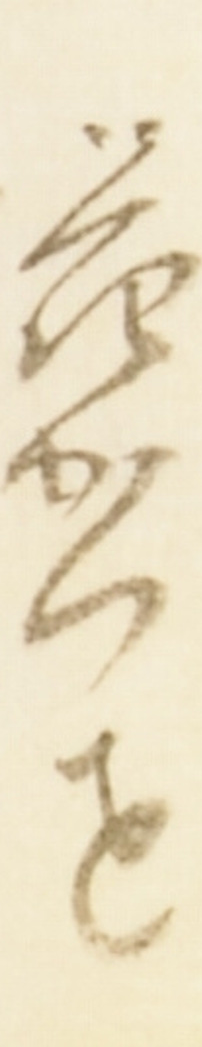花かつを
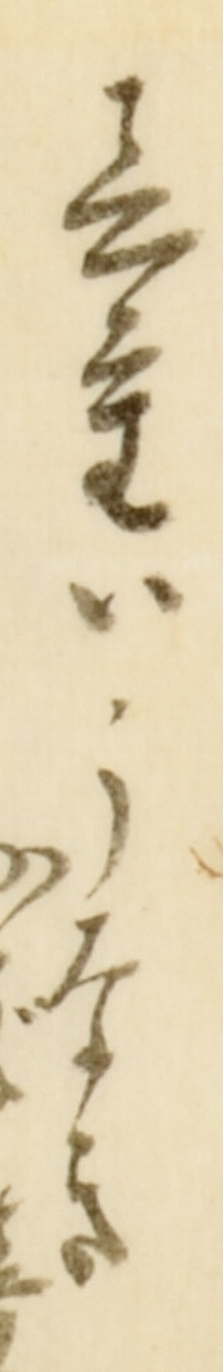壱重ハうなぎ
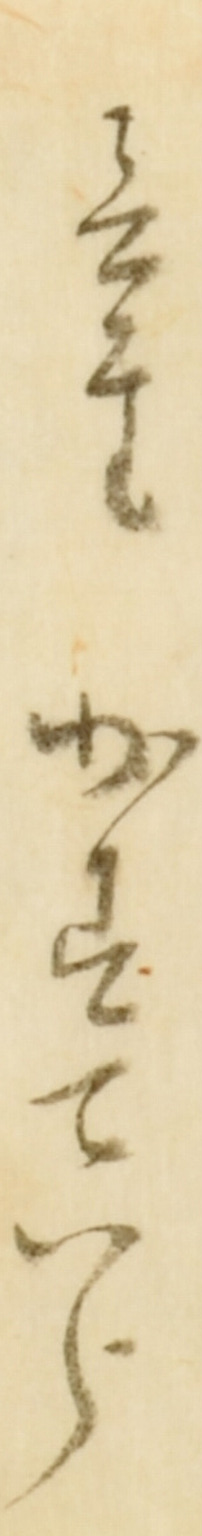壱重かすていら

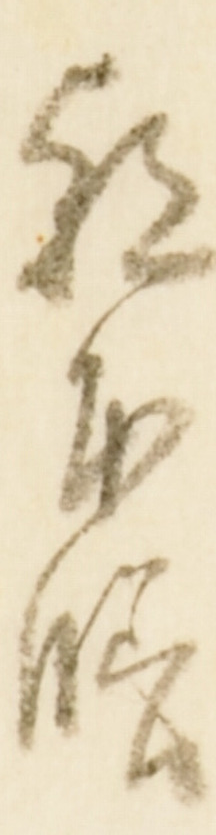朝本膳
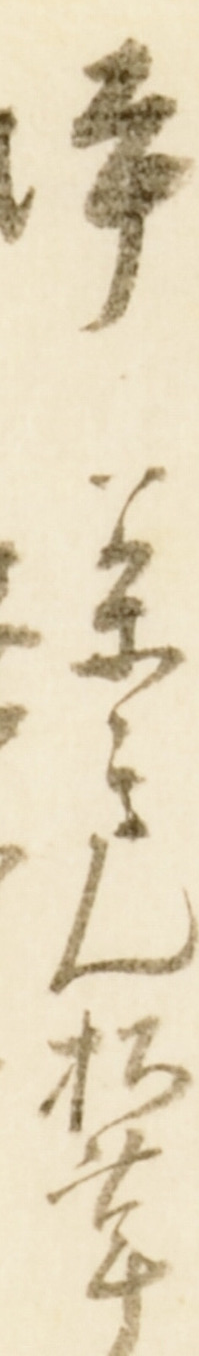坪茶きん松茸
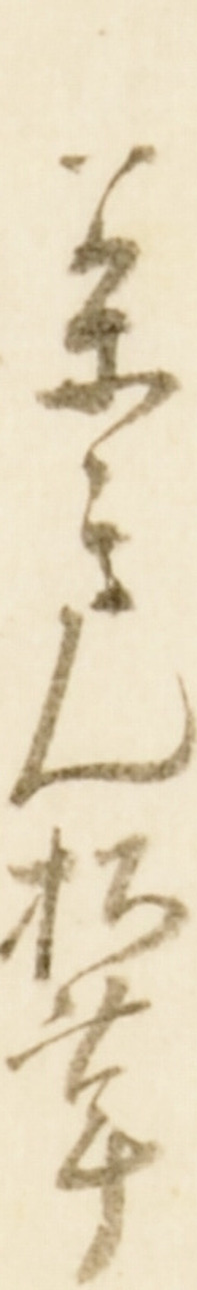坪茶きん松茸
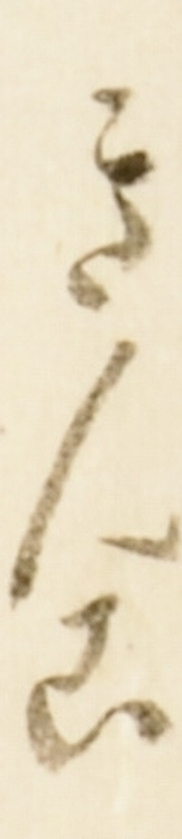きんこ
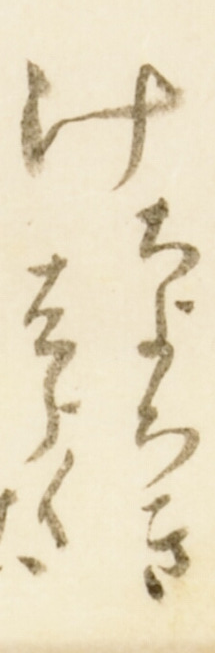汁ちよろき
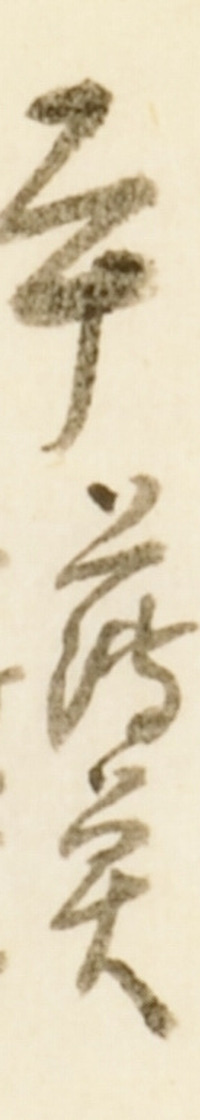平薄魚
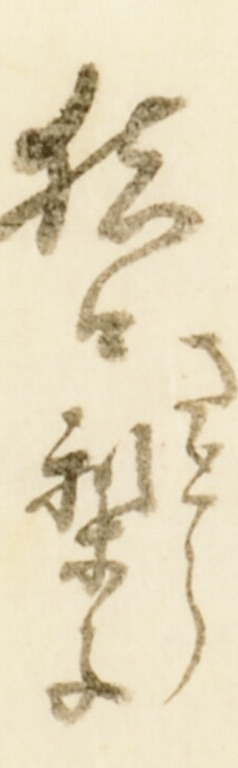猪口梨子
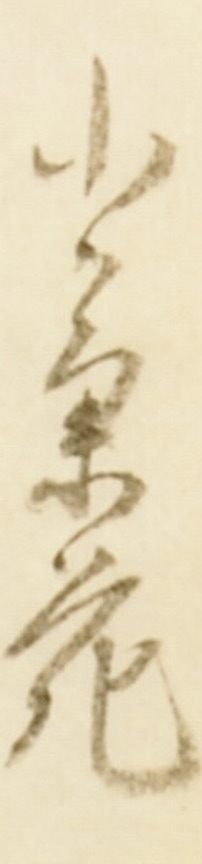小菊花
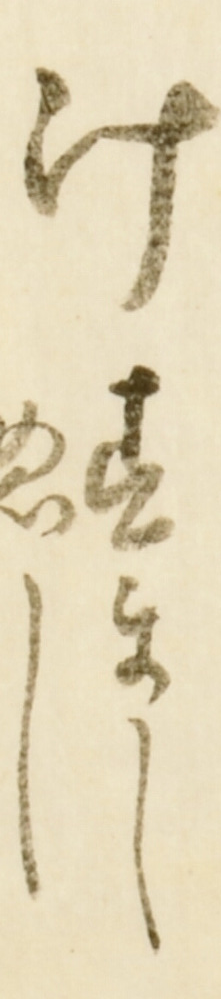汁すまし
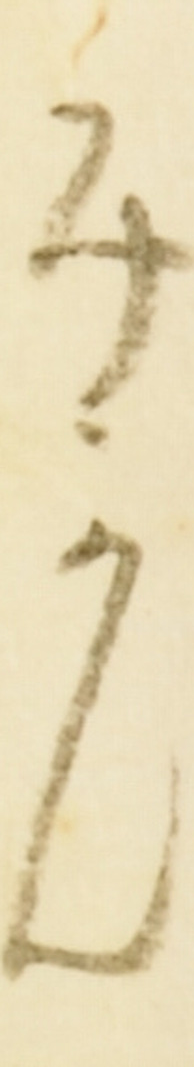みかん
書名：（覚）
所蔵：伊那市立高遠町図書館・合同会社AMANE
